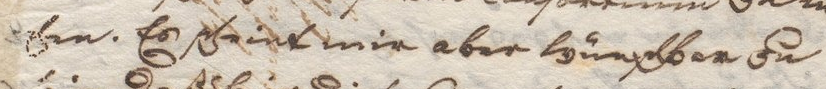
chen. Es scheint mir aber wünschbar zu
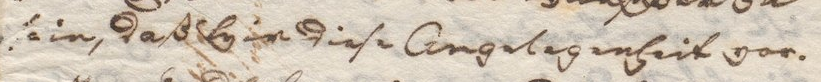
sein, daß wir diese Angelegenheit vor-
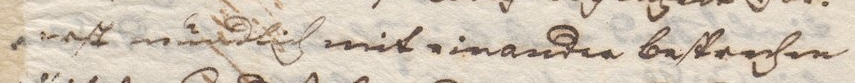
erst mündlich mit einander besprechen
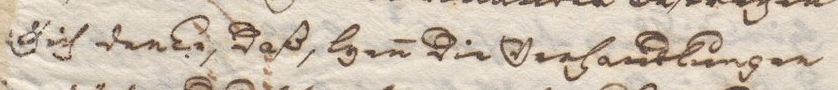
ich denke, daß, wenn die Verhandlungen
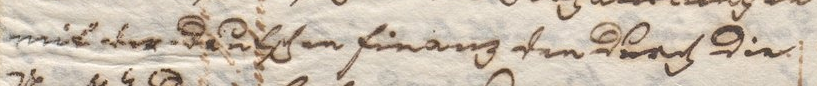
mit der deutschen Finanz den durch die
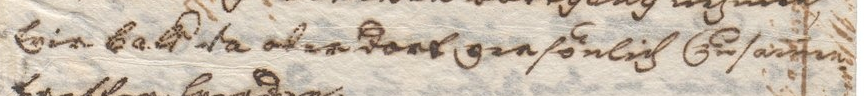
wir bald da oder dort persönlich zusammen-
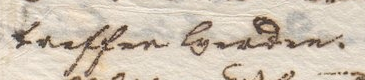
treffen werden.
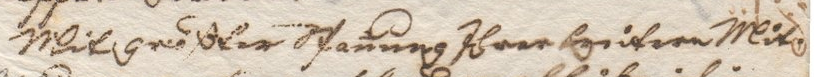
Mit größter Spannung Ihrer weitern Mit-
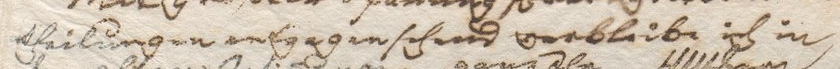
theilungen entgegensehend verbleibe ich in
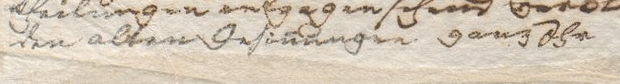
den alten Gesinnungen ganz Ihr
